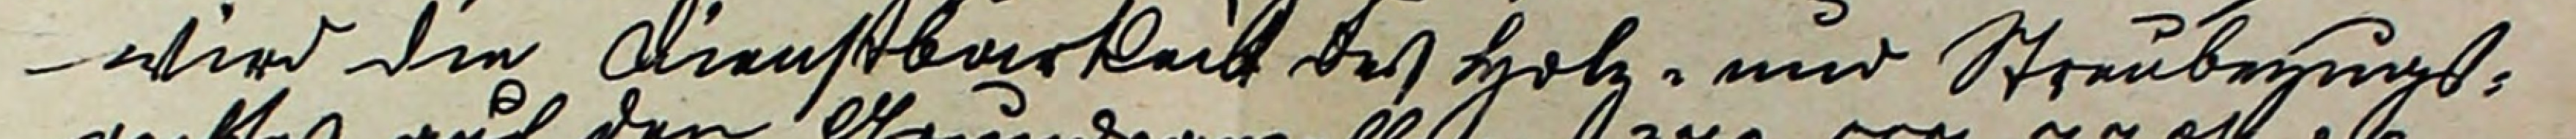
wird die Dienstbarkeit des Holz- und Streubezugs„
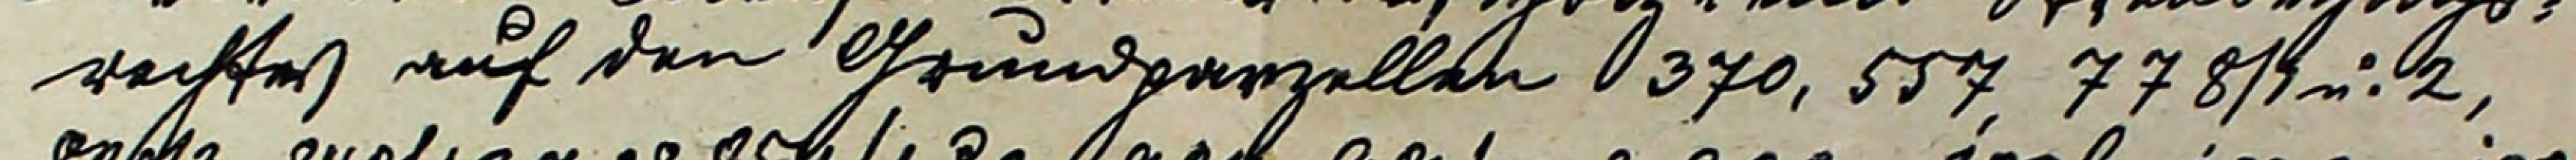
rechtes auf den Grundparzellen 370, 557, 778/1 u. 2,
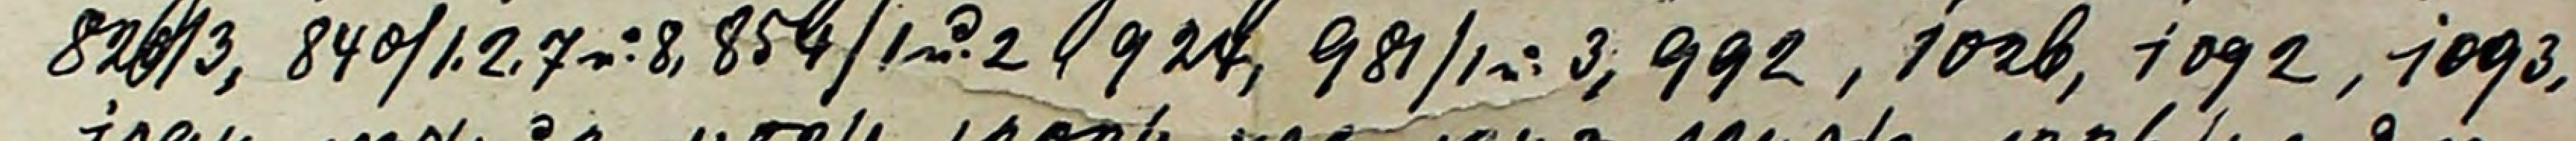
820/3, 840/ 1, 2, 7 u. 8, 854/ 1 u. 2, 924, 981/1 u. 3, 992, 1026, 1092, 1093,
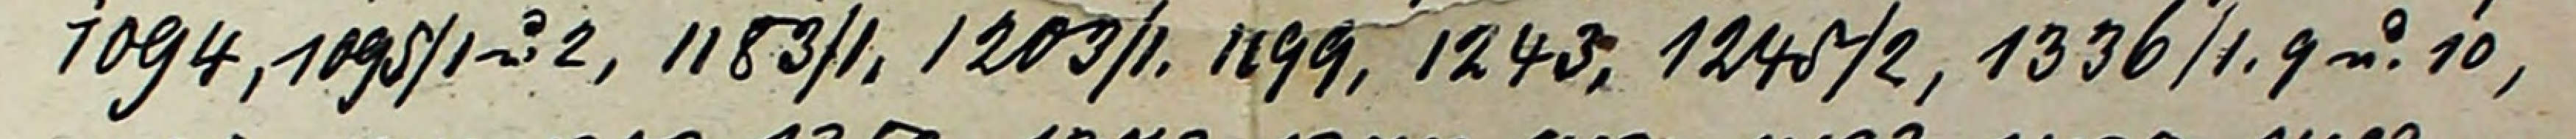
1094, 1095/1 u. 2, 1183/1, 1203/1, 1199, 1245, 1245/2, 1336/1, 9 u. 10,
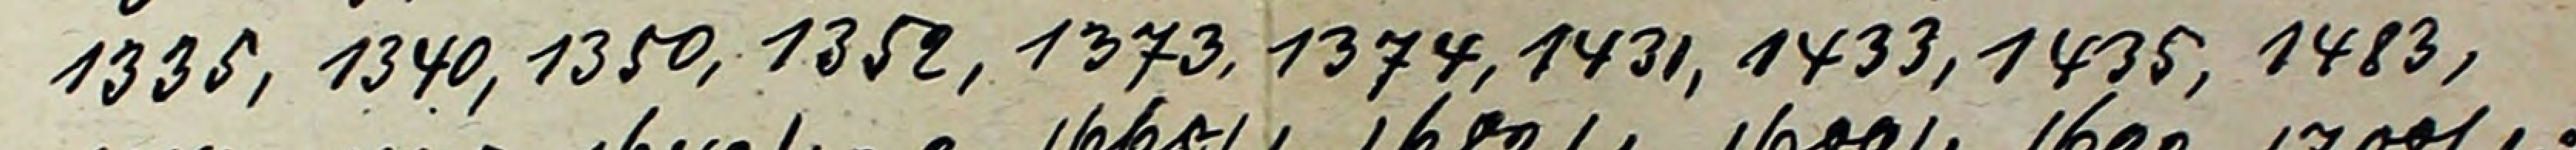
1335, 1340, 1350, 1352, 1373, 1374, 1431, 1433, 1435, 1483,
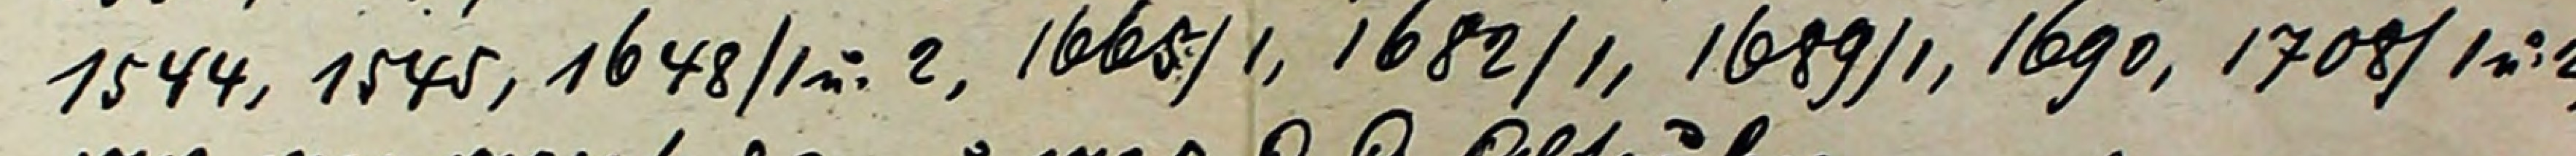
1544, 1545, 1648/ 1 u. 2, 1665/1, 1682/1, 1689/1, 1690, 1708/ 1 u. 2,
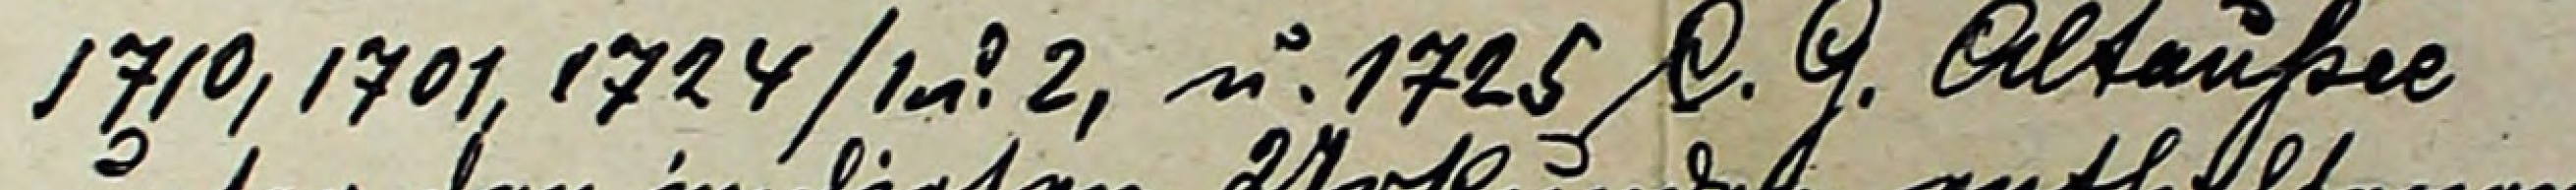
1710, 1701, 1724/ 1 u. 2, u. 1725 C. G. Altaussee
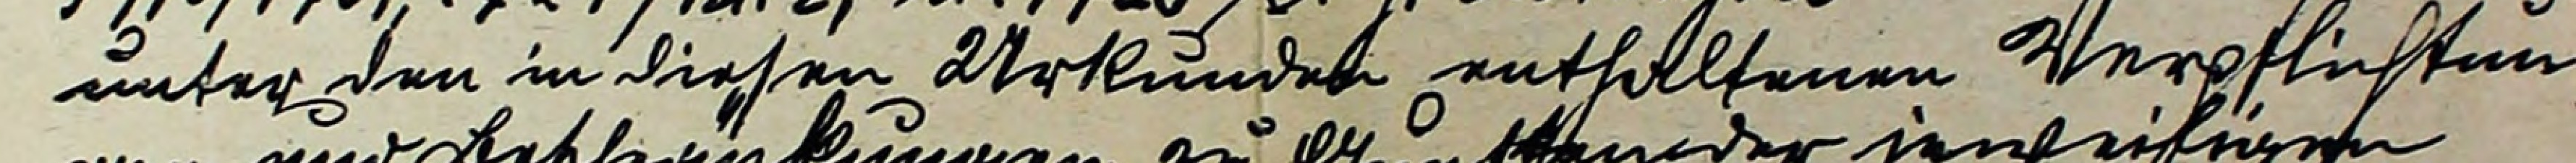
unter den in diesen Urkunden enthaltenen Verpflichtun
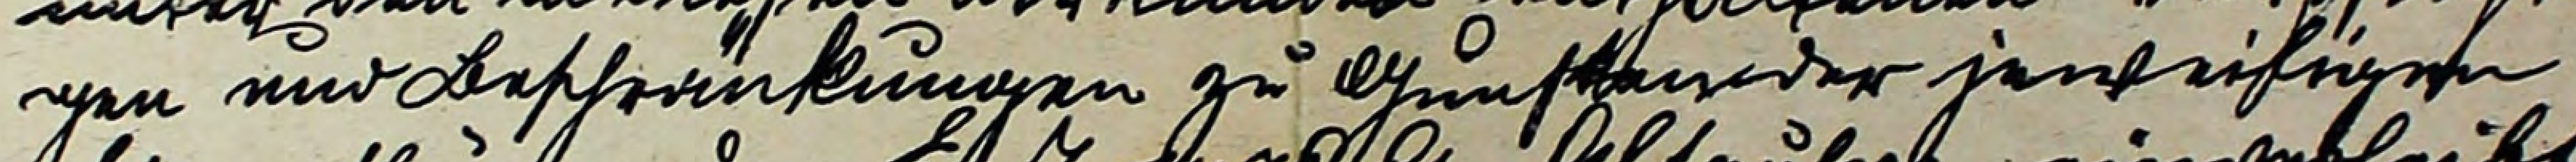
gen und Beschränkungen zu Gunstender jeweiligen
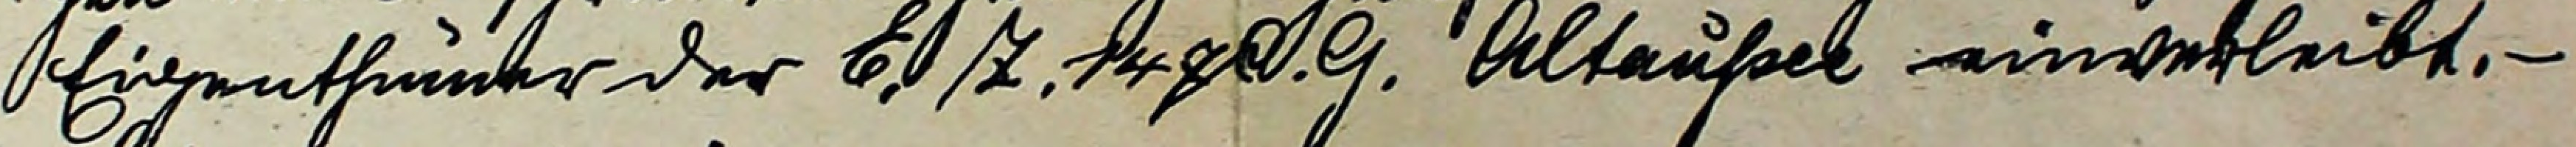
Eigenthümer der E. Z. 1476. G. Altaussee einverleibt. —
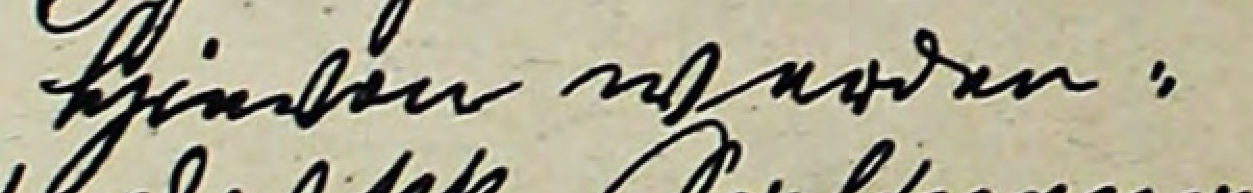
Hievon werden:
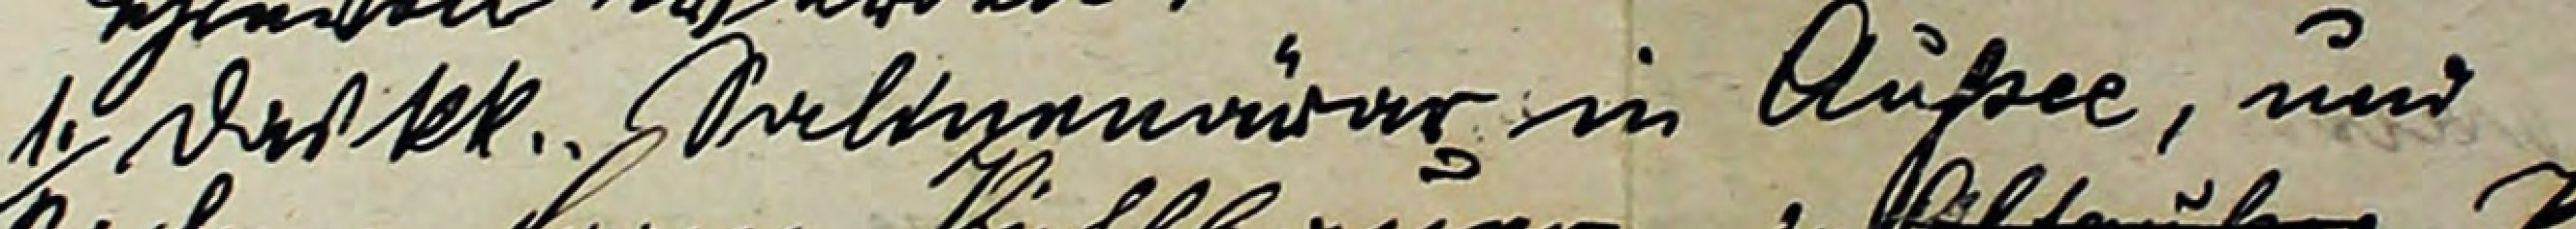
1. Das kk. Salinenärar in Aussee, und
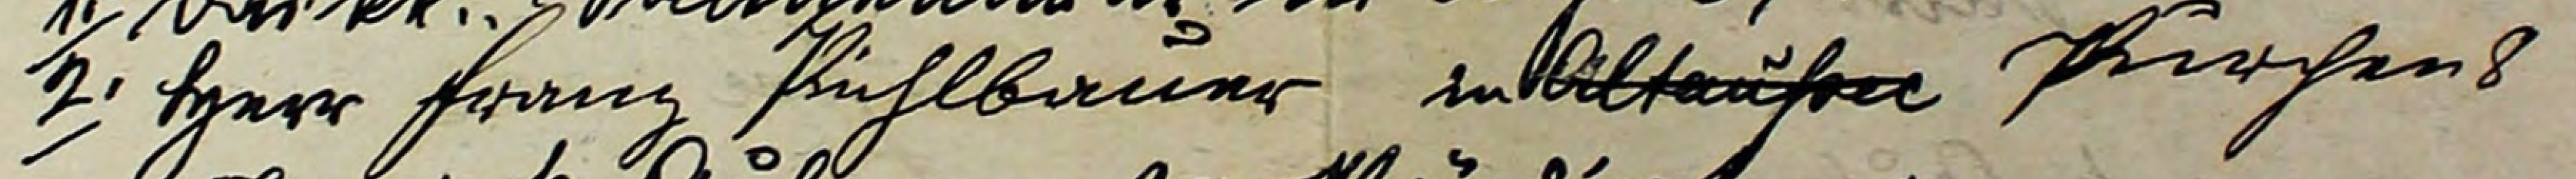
2. Herr Franz Pichtlbauer in Purchen 8
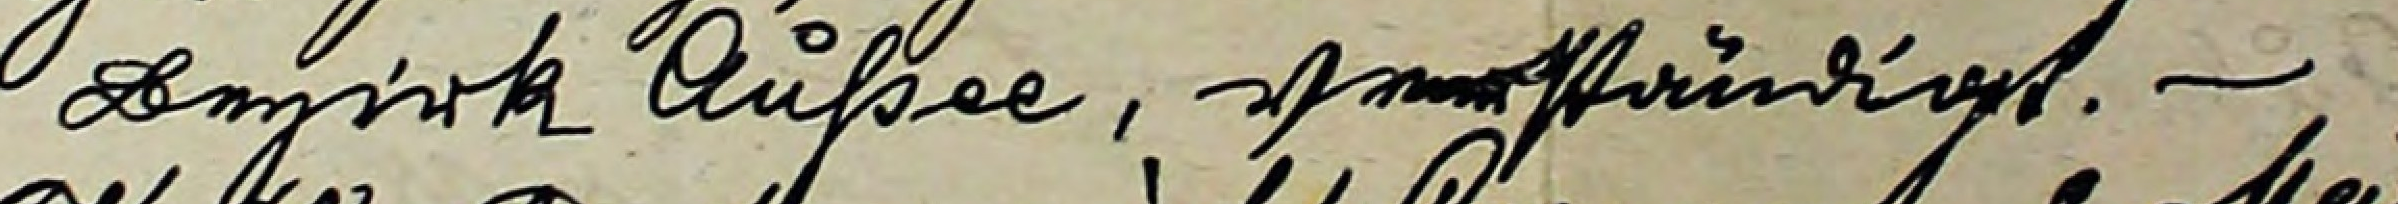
Bezirk Aussee, verständigt. —
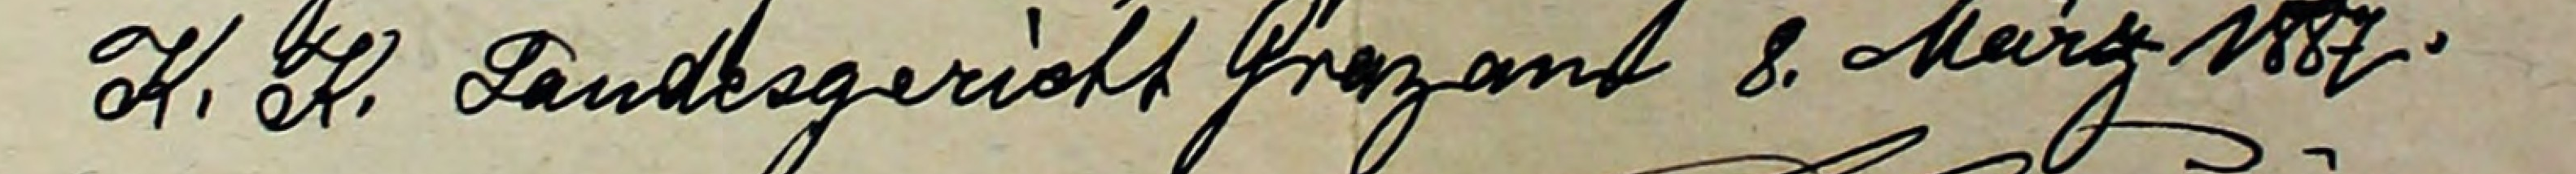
K.K. Landesgericht Grazam 8. März 1887.
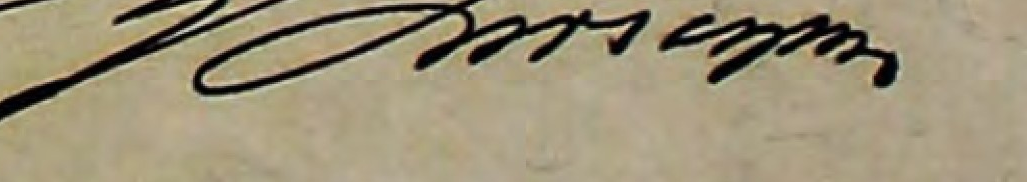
???
